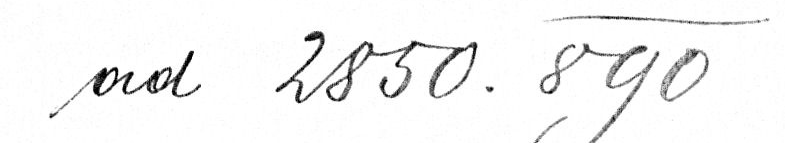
ad 2850. 890
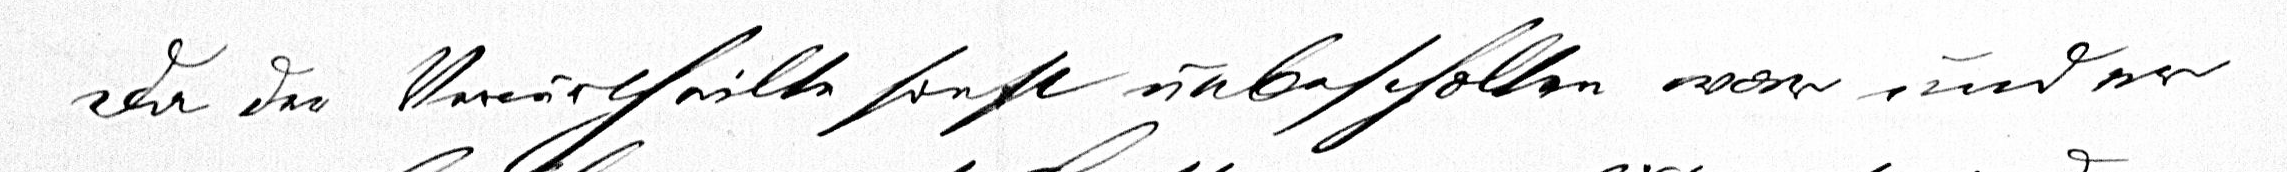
Da der Verurtheilte sonst unbescholten war und er
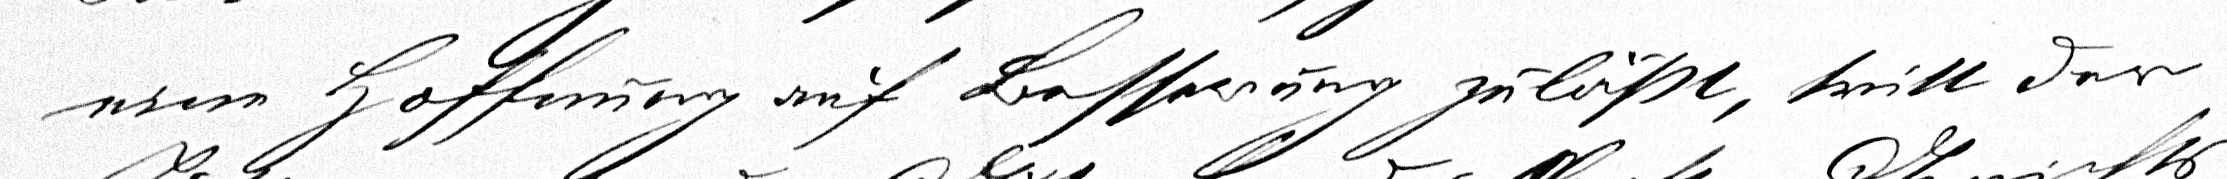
eine Hoffnung auf Besserung zuläßt, tritt der
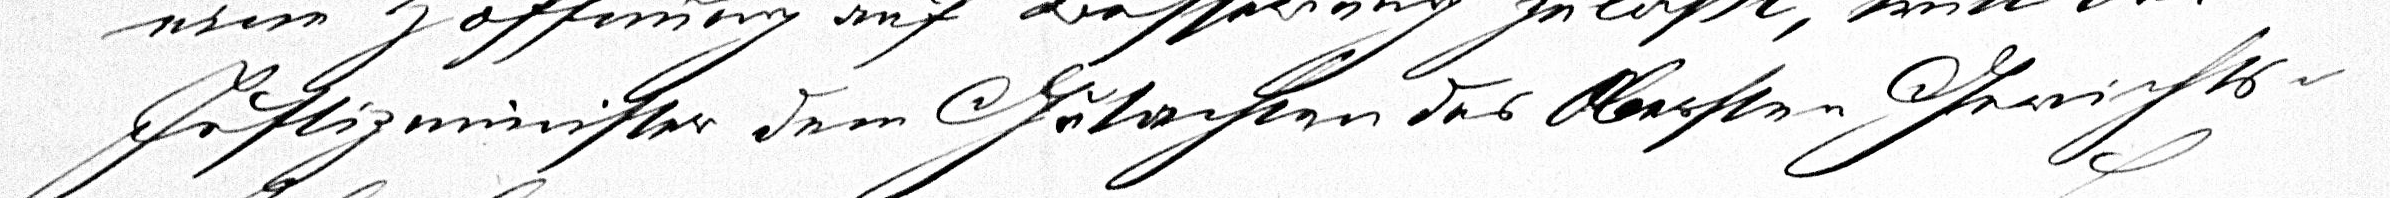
Justizminister dem Gutachten des Obersten Gerichts¬
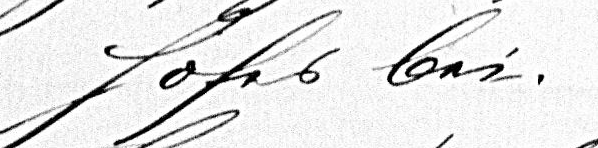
hofes bei.
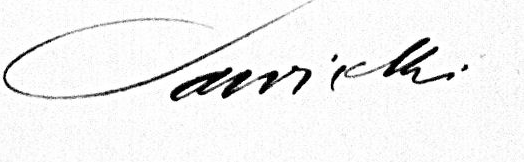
Sawixx
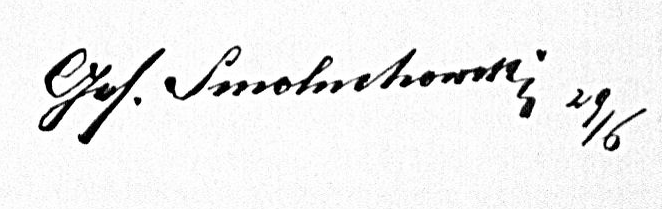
Ges. Smolxx 29/16
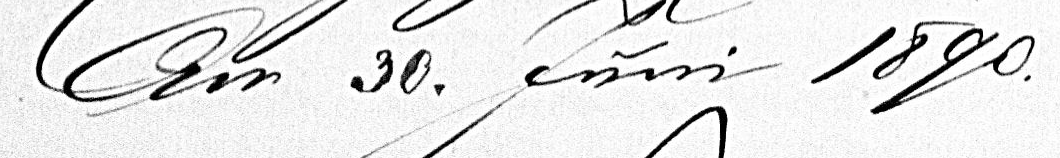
Am 30. Juni 1890
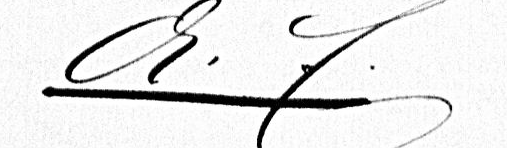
A. E.
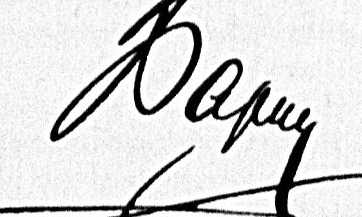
xx
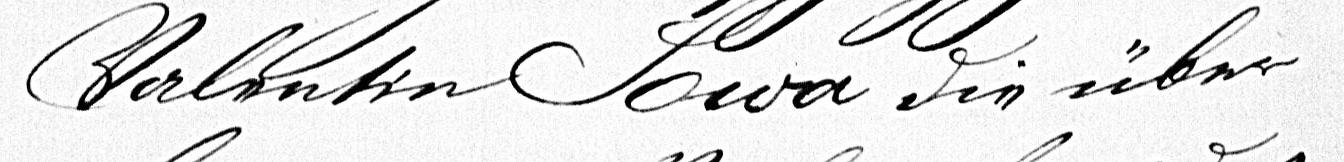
Valentin Sowa die über
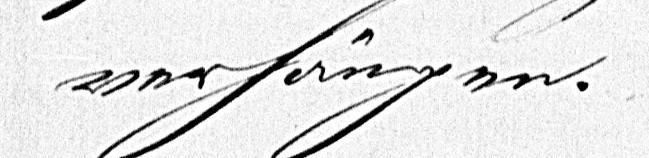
verhängen.
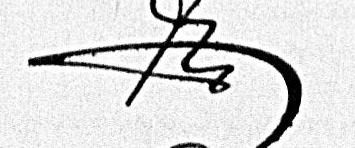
xx
